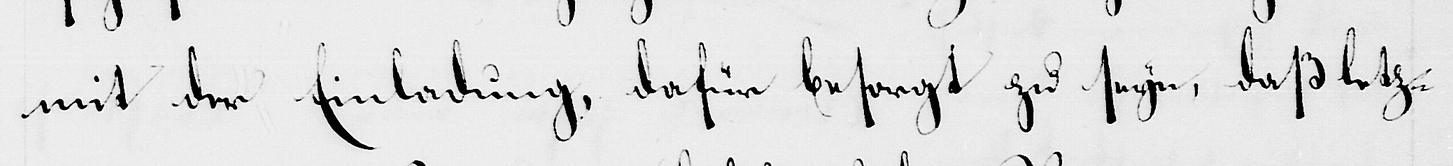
mit der Einladung, dafür besorgt zu seyn, daß letz¬
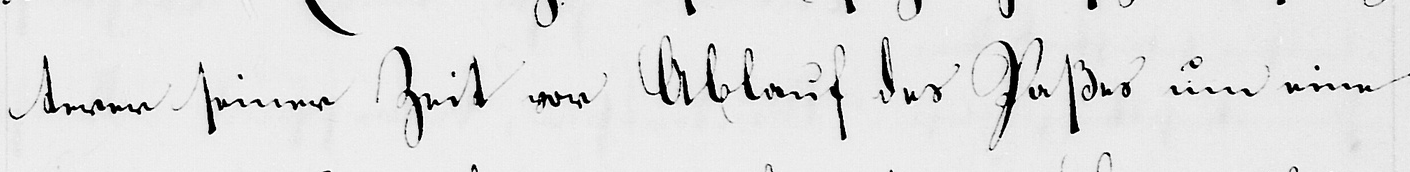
terer seiner Zeit vor Ablauf des Paßes um eine
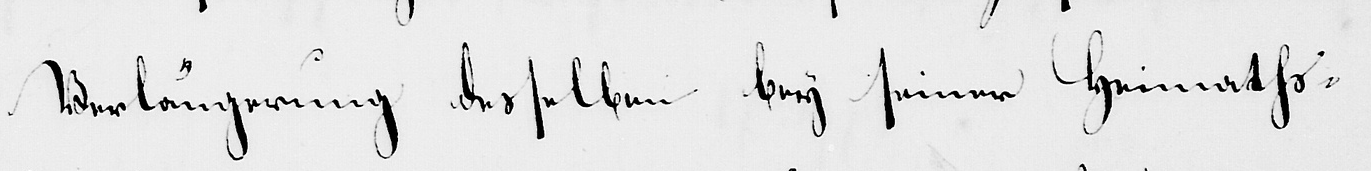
Verlängerung desselben bey seiner Heimaths¬
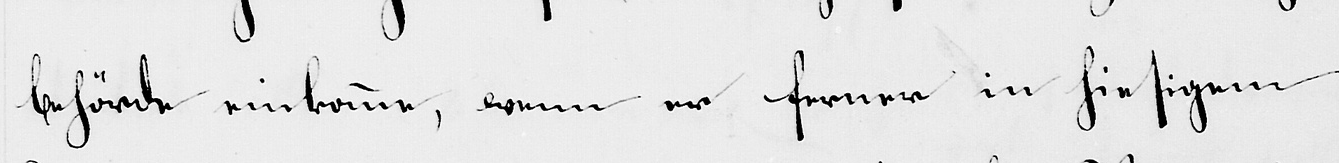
behörde einkomme, wenn er ferner in hiesigem
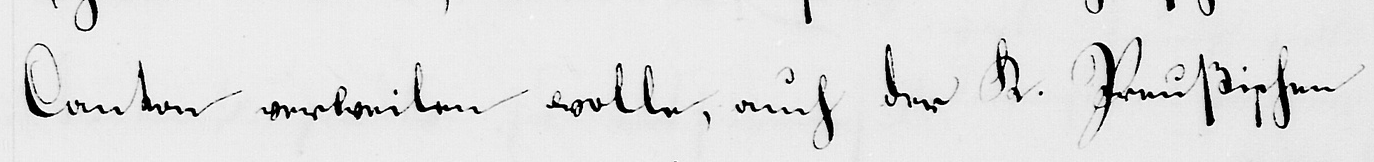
Canton verweilen wolle, auch der K. Preußischen
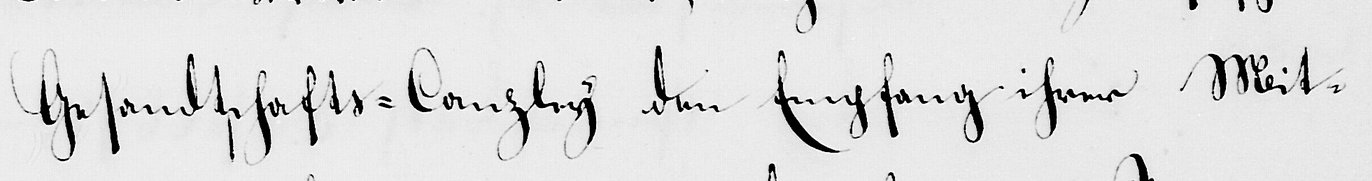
Gesandtschafts-Canzley den Empfang ihrer Mit¬
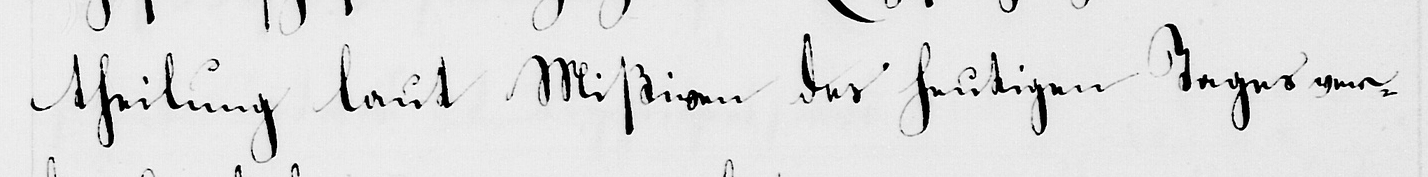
theilung laut Mißiven des heutigen Tages ver¬
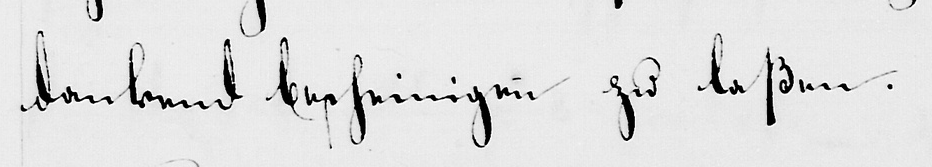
dankend bescheinigen zu laßen.
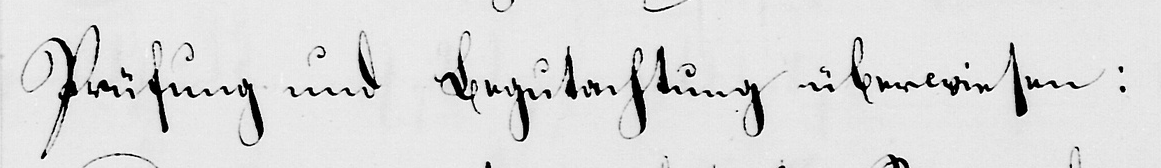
Prüfung und Begutachtung überwiesen:
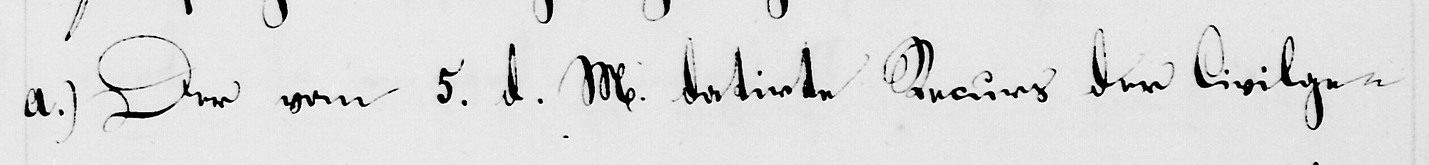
a.) Der vom 5. d. M. datirte Recurs der Civilge-
